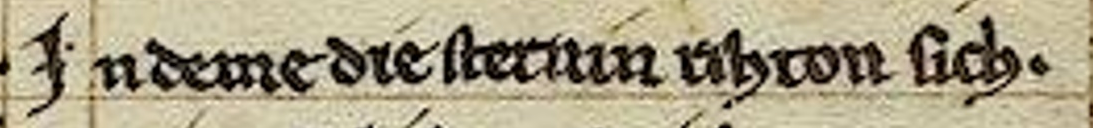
In deme die ſternin rihton ſich.
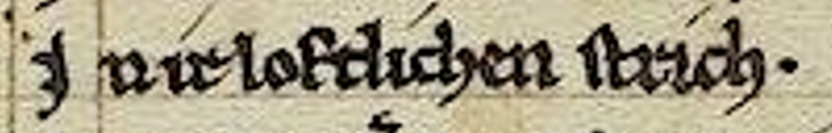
In ir loftlichen ſtrich.
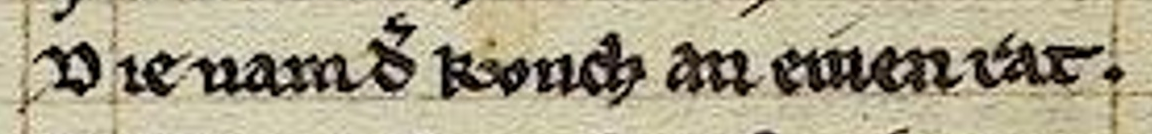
Die nam d(er) kvnch an einen rat.
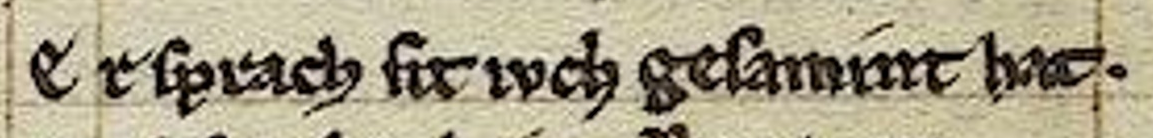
Er ſprach ſit ivch geſamint hat.
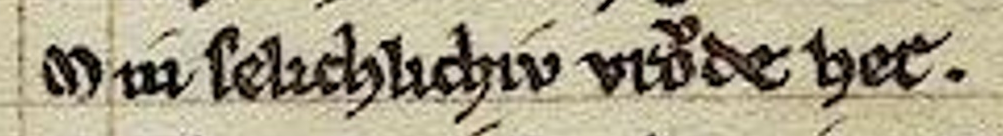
Min ſelichlichiv vro°vde her.
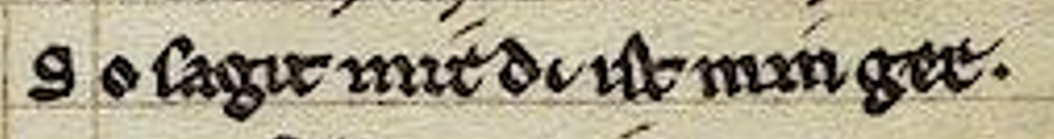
So ſagit mir d(az) iſt min ger.
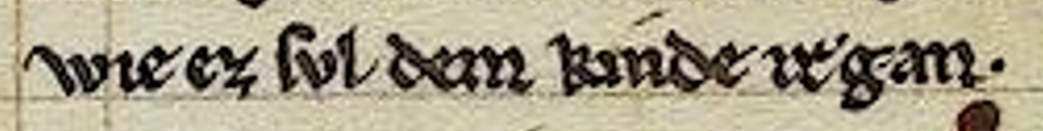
Wie ez ſvl dem kinde irgan.
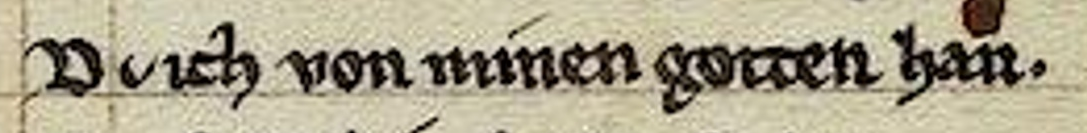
D(az) ich von minen gotten han.
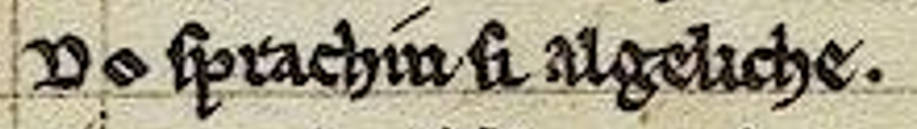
Do ſprachin ſi algeliche.
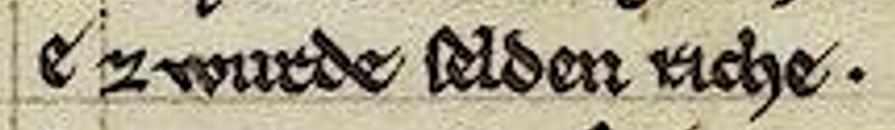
Ez wurde ſelden riche.
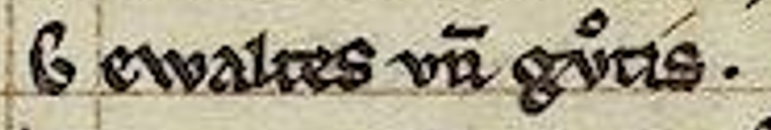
Gewaltes vn(d) gv°otis.
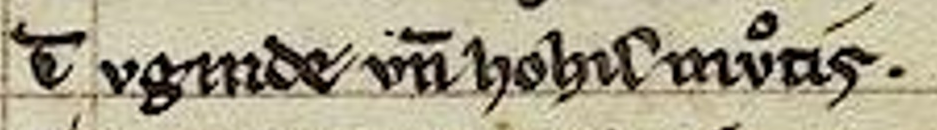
Tvginde vn(d) hohiſ mv°otis.
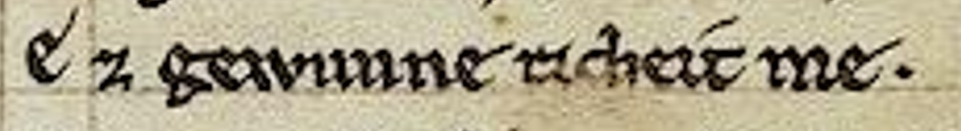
Ez gewunne richeit me.
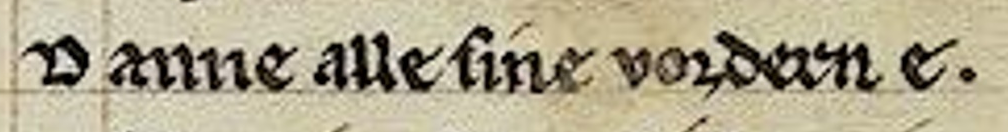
Danne alle ſine vordern e.
